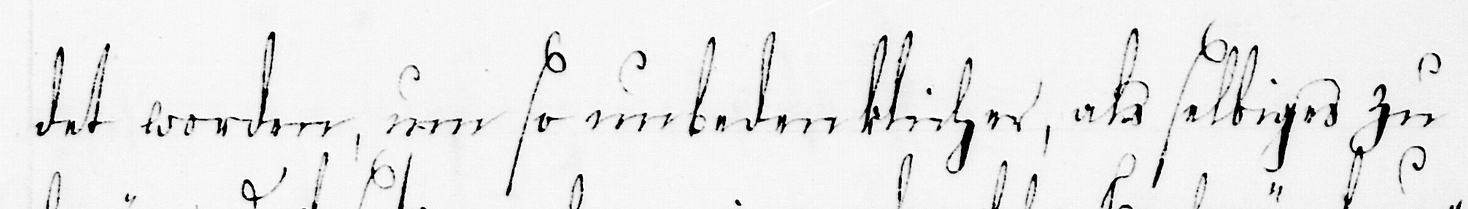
det worden, um so unbedenklicher, als selbiges zu
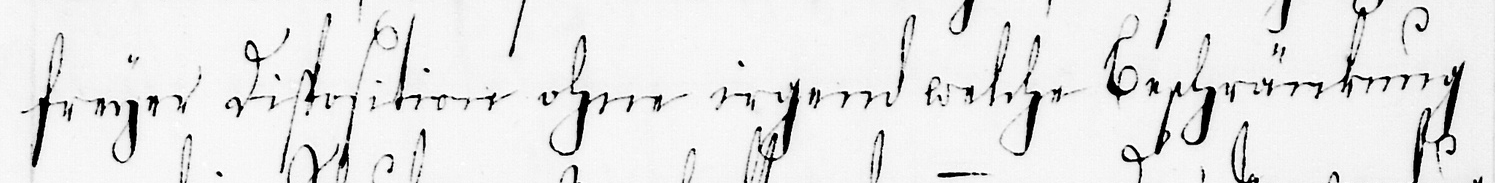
freyer Disposition ohne irgend welche Beschränkung
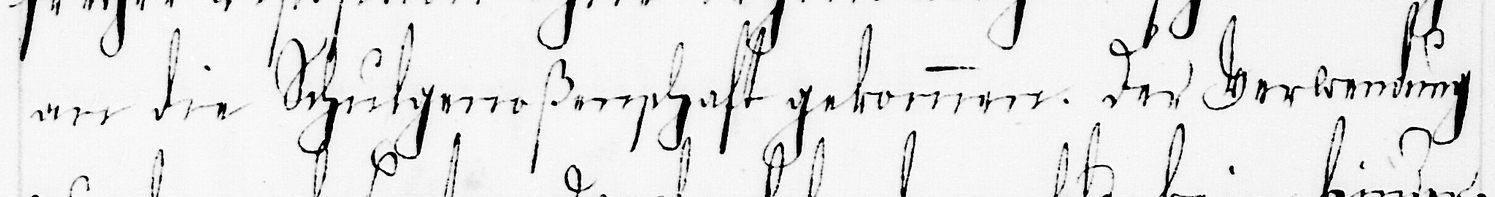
an die Schulgenoßenschaft gekommen. Der Verwendung
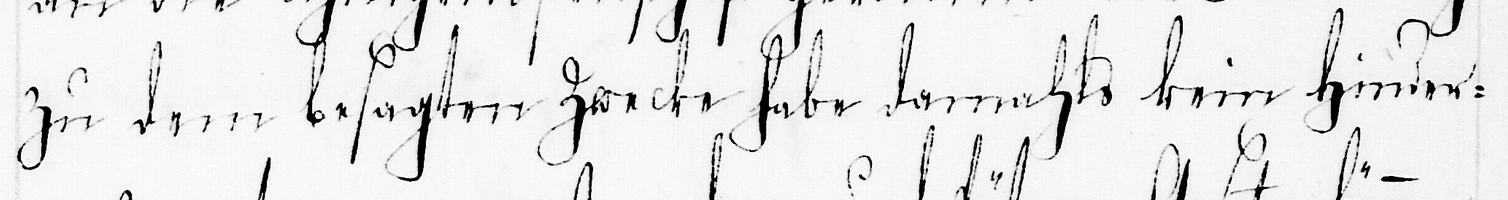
zu dem besagten Zwecke habe damahls kein Hinder¬
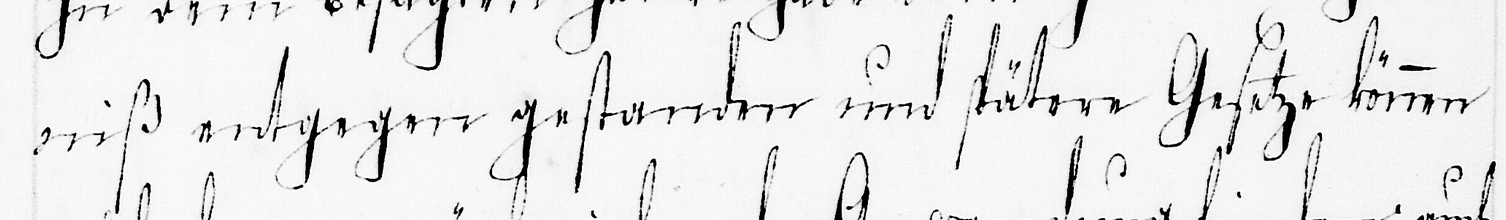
niß entgegen gestanden und spätere Gesetze können
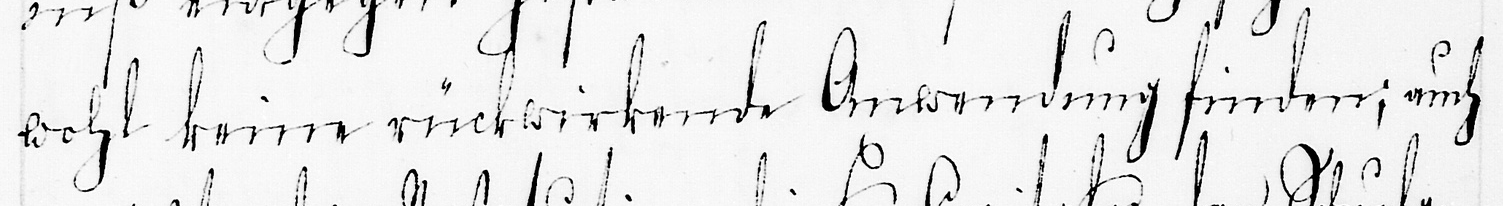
wohl keine rückwirkende Anwendung finden; auch
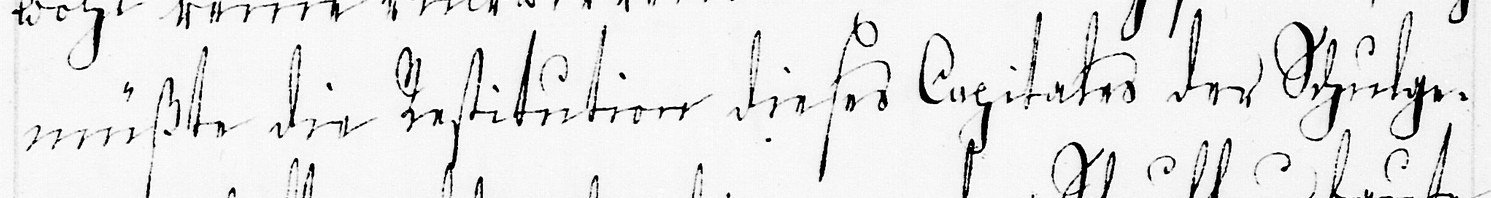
müßte die Restitution dieses Capitales der Schulge¬
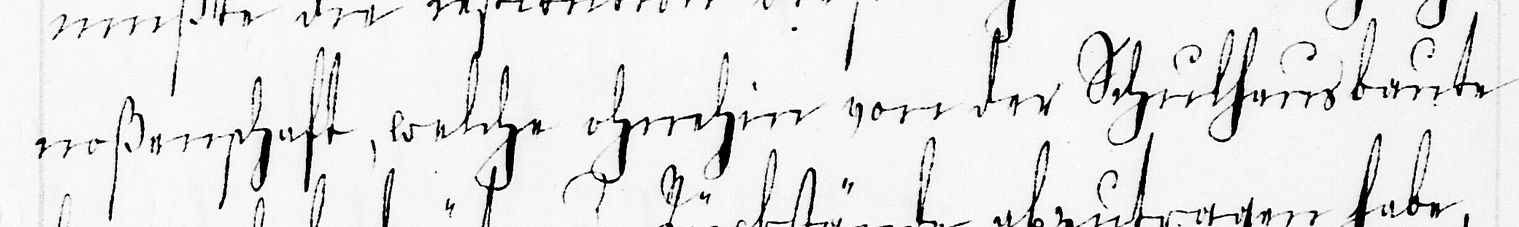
noßenschaft, welche ohnehin von der Schulhausbaute
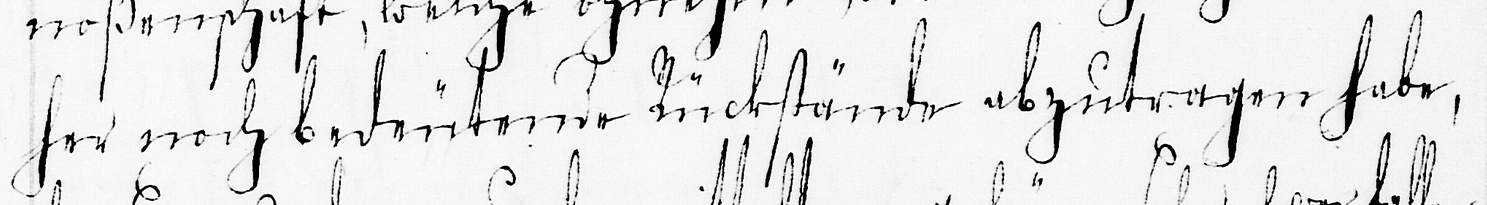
her noch bedeutende Rückstände abzutragen habe,
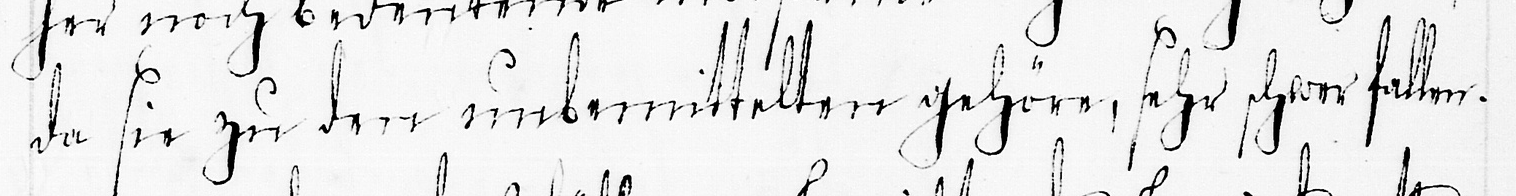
da sie zu den unbemittelten gehöre, sehr schwer fal¬
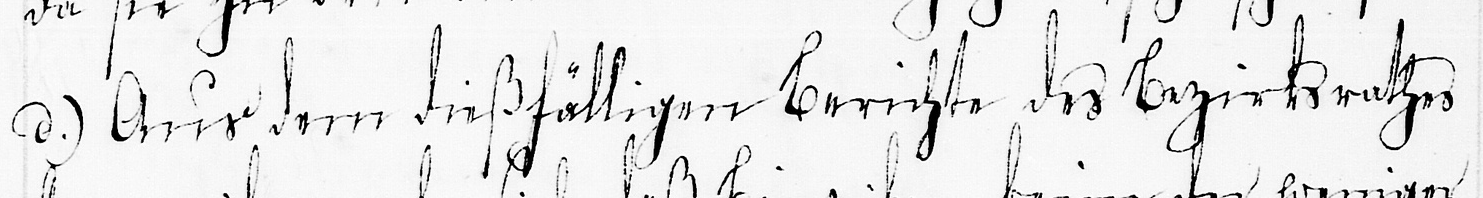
d) Aus dem dießfälligen Berichte des Bezirksrathes
